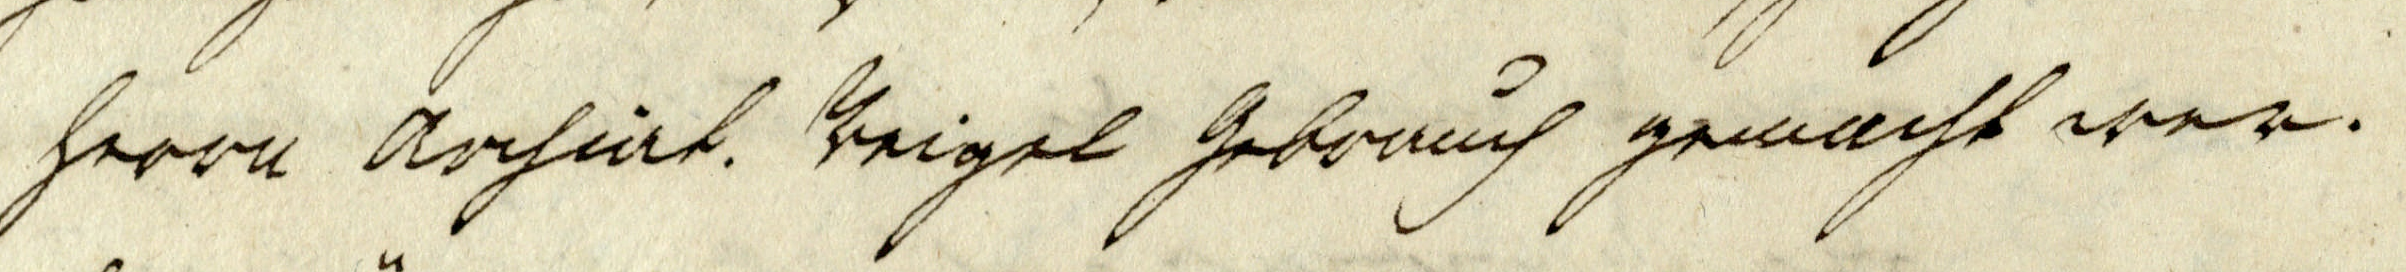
Herrn Archiat. Weigel Gebrauch gemacht wer-
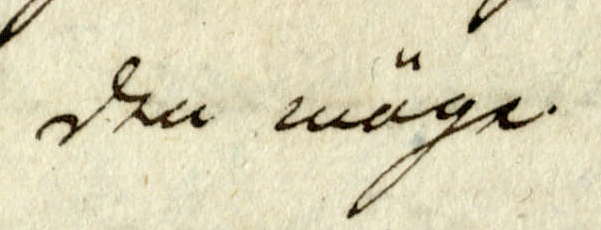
den möge.
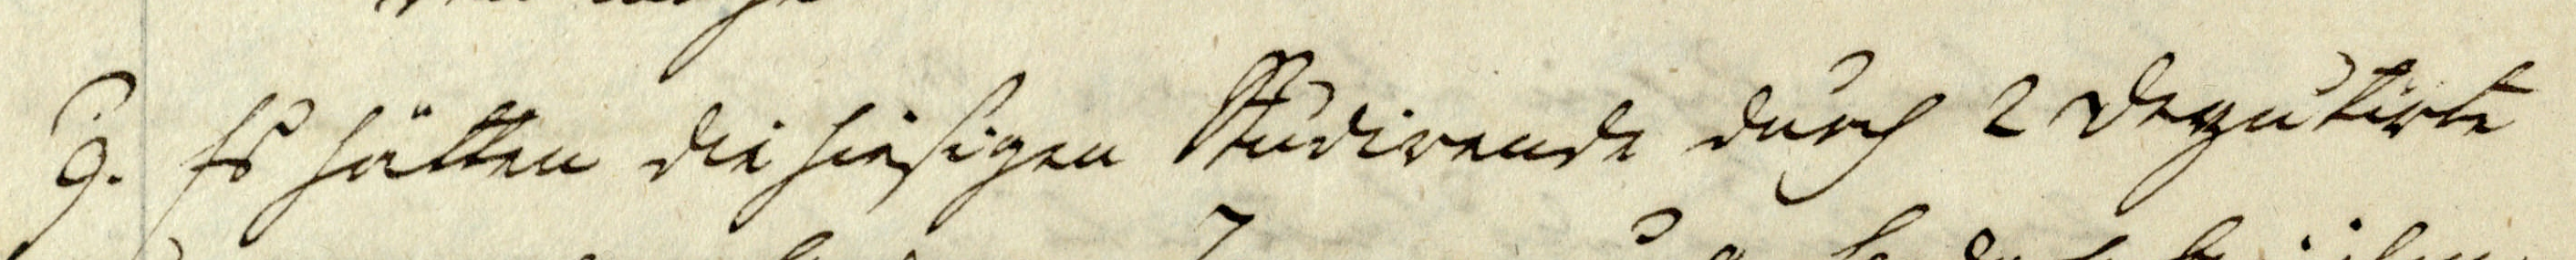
9. Es hätten die hiesigen Studirende durch 2 Deputirte
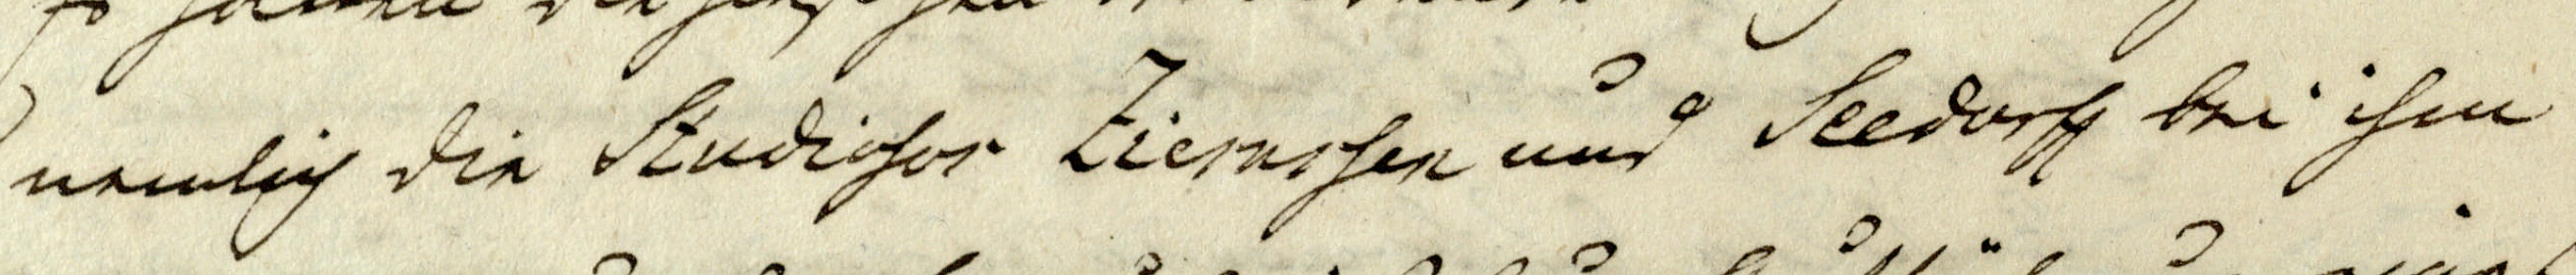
nemlich die Studiosos Ziemssen und Seedorff bei ihm
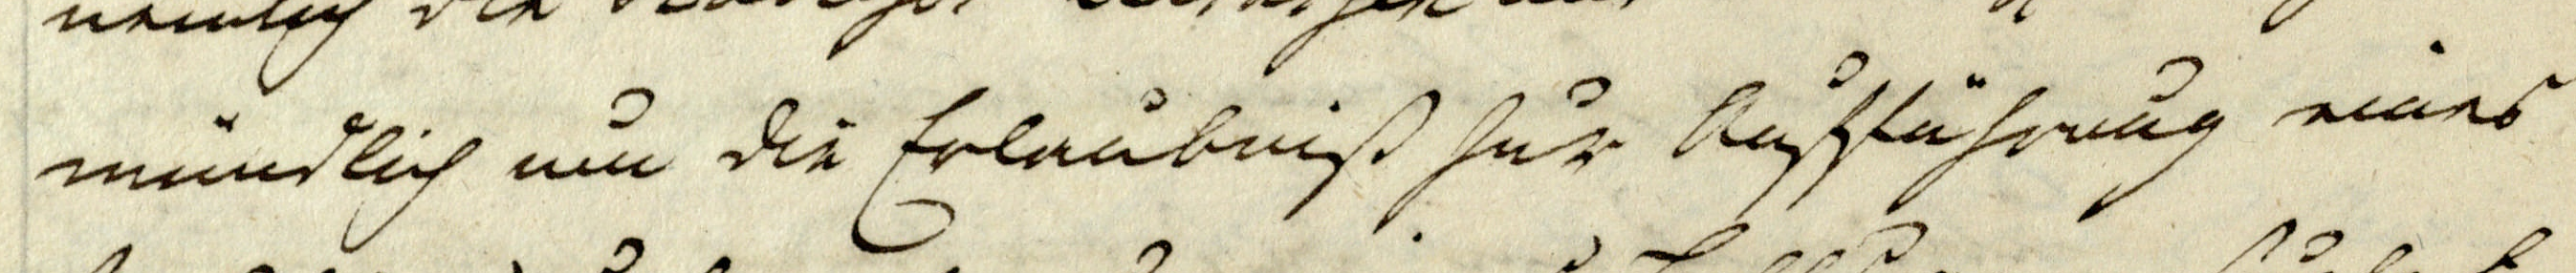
mündlich um die Erlaubniß zur Aufführung eines
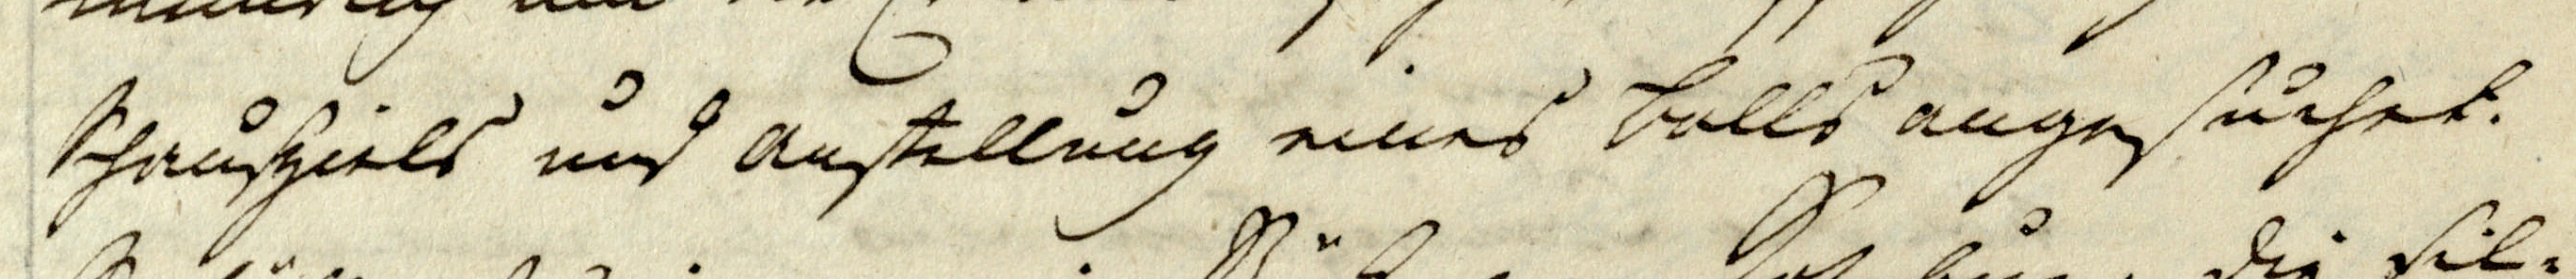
Schauspiels und Anstellung eines Balls angesuchet.
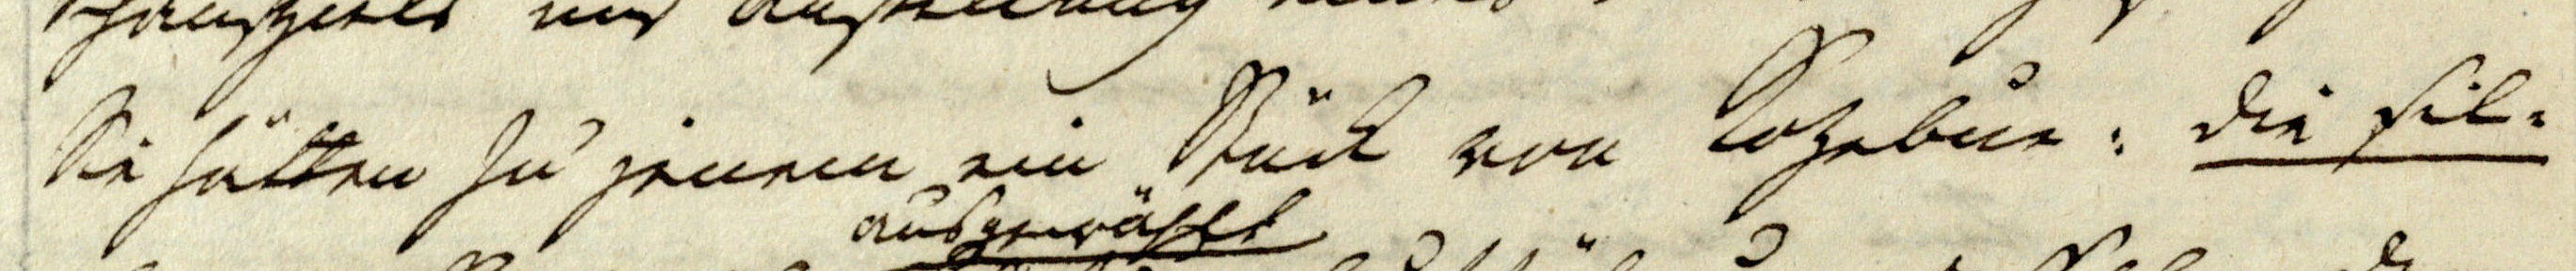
Sie hätten zu jenem den Stück von Kozebue: die sil¬
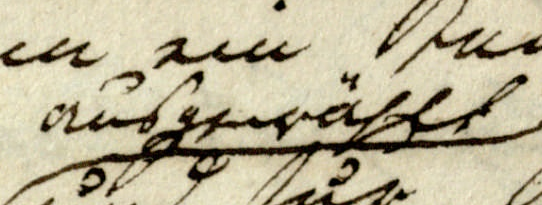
ausgewählt
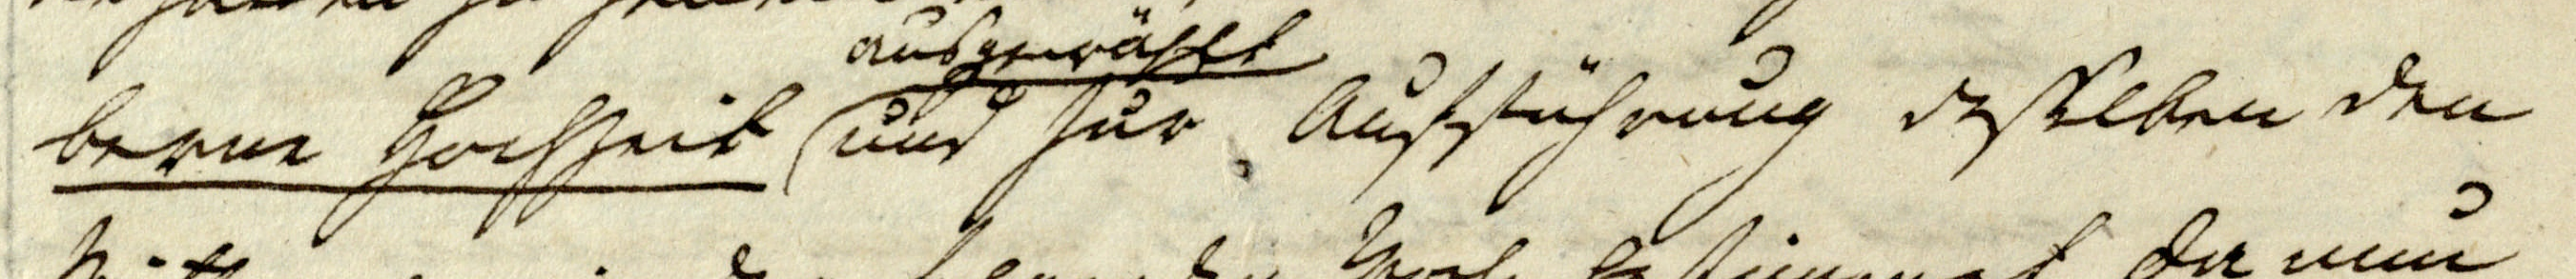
berne Hochzeit und zur Auführung desselben den
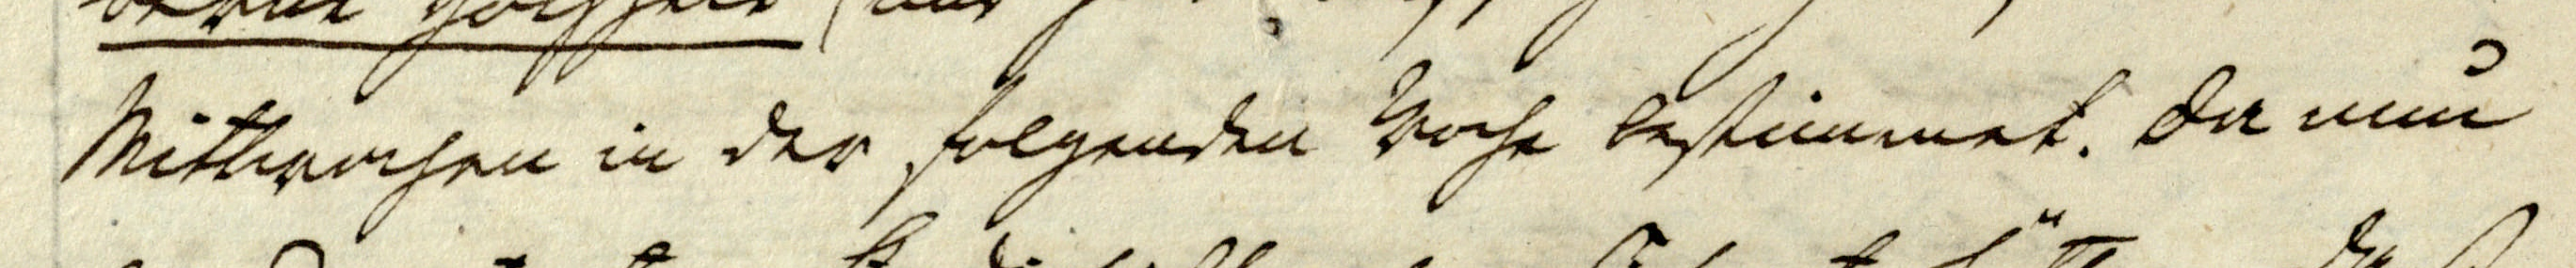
Mittwochen in der folgenden Woche bestimmet. Da nun
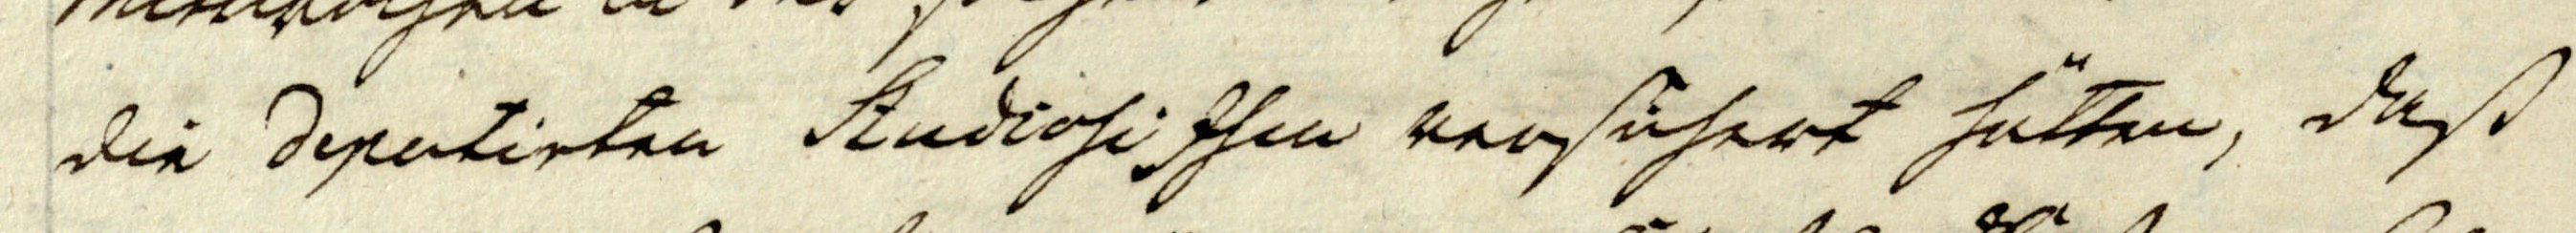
die deputirten Studiosi ihm versichert hätten, daß
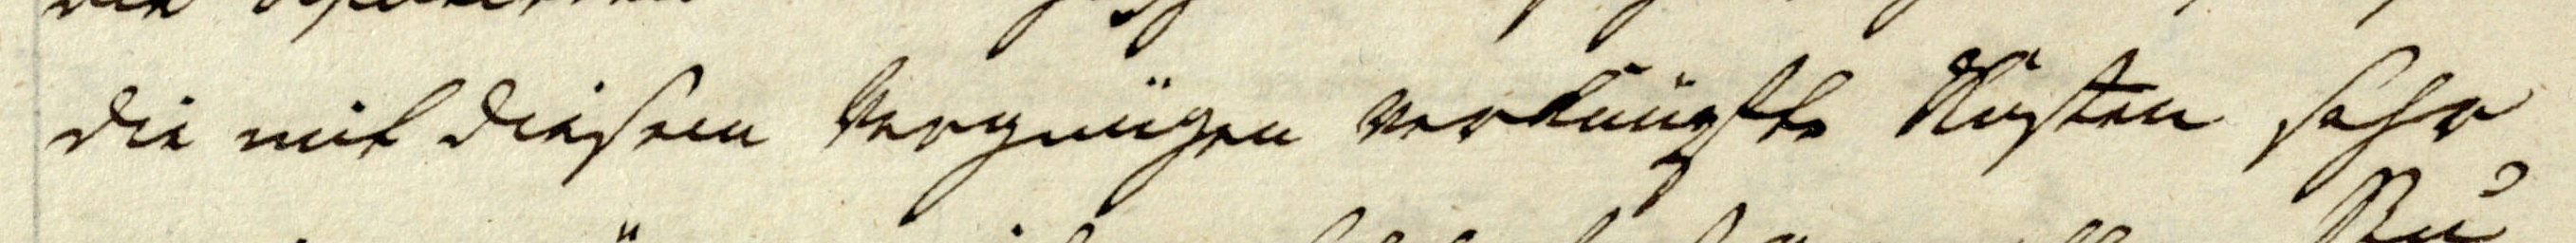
die mit diesem Vergnügen verknüpfte Kosten sehr
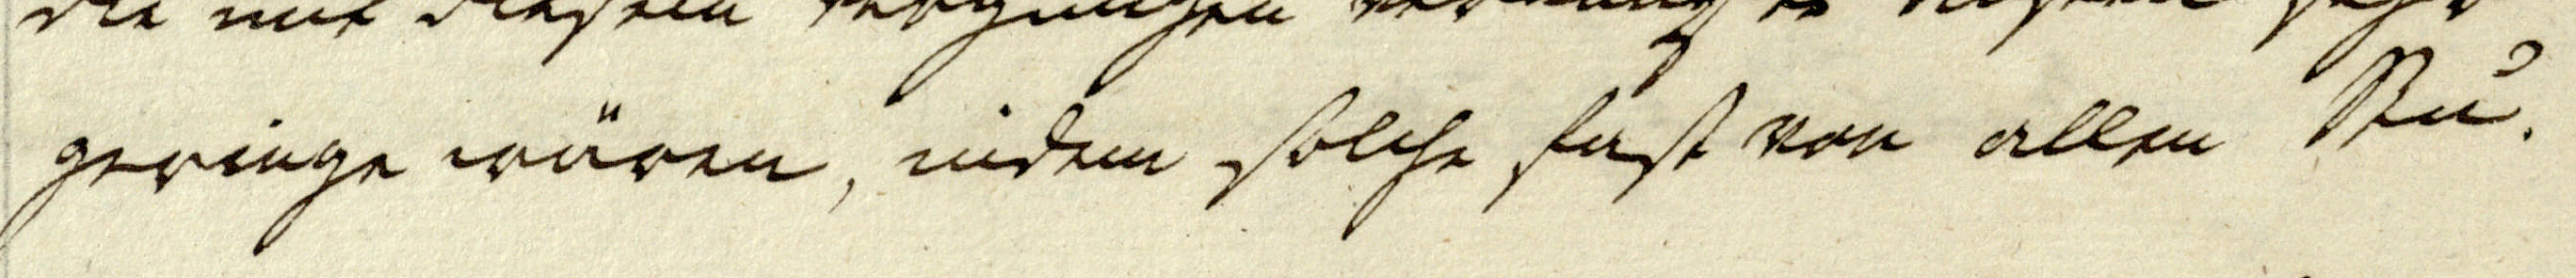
geringe wären, indem solche fast von allen Stu¬
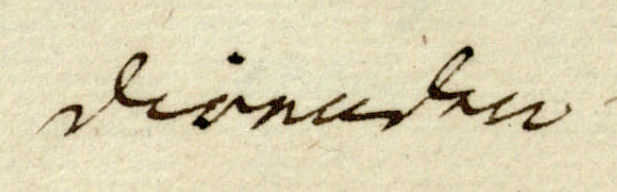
direnden
